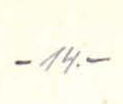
14.
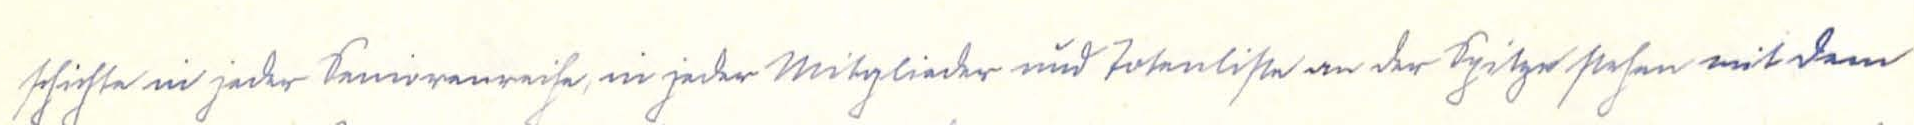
schichte in jeder Seniorenreihe, in jeder Mitglieder und Totenliste an der Spitze stehen mit dem
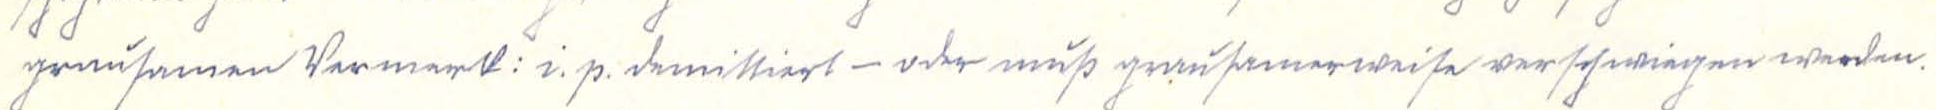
grausamen Vermerk: i.p. dimittiert - oder muß grausamerweise verschwiegen werden.
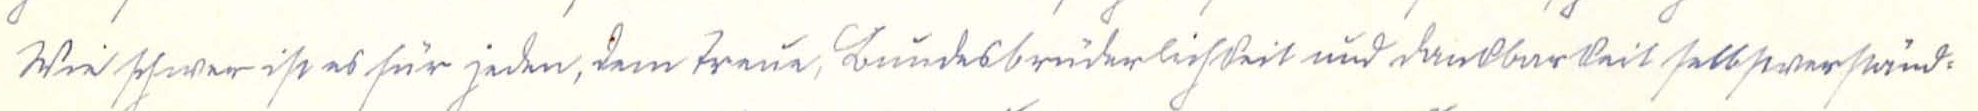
Wie schwer ist es für jeden, dem treue Bundesbrüderlichkeit und Dankbarkeit selbstverständ-
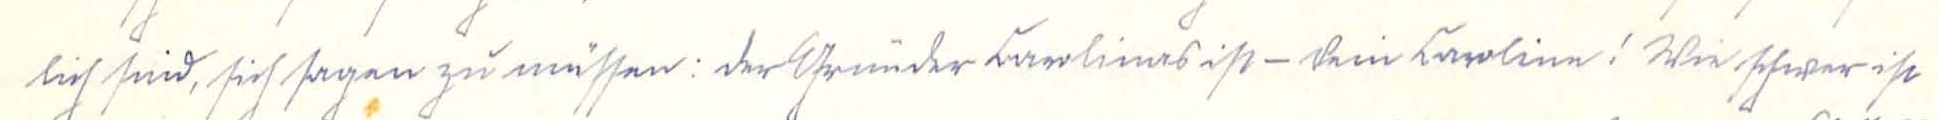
lich sind, sich sagen zu müssen: Der Gründer der Carolina ist - kein Caroline! Wie schwer ist
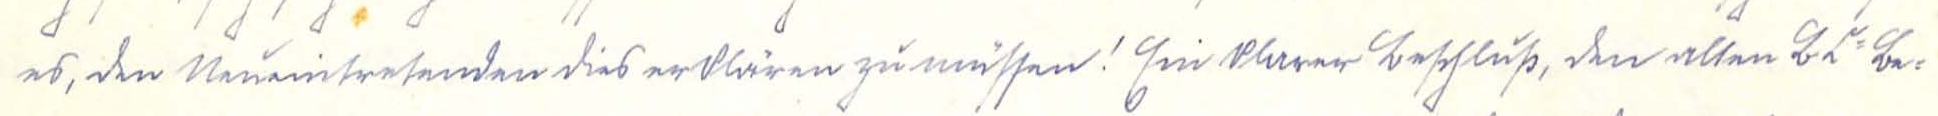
es, den Neueintretenden dies erklären zu müssen! Ein klarer Beschluß, den alten BC-Be-
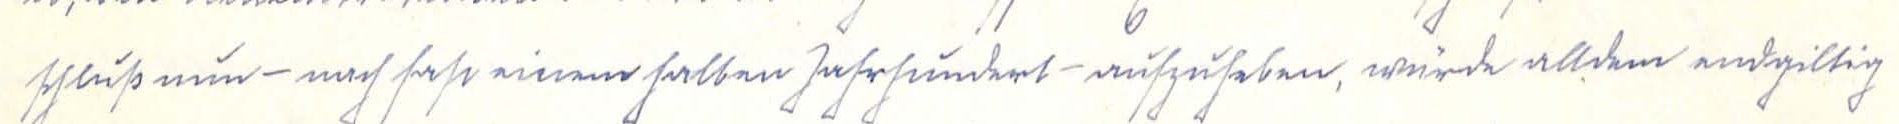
schluss nun - nach fast einem halben Jahrhundert - aufzuheben, würde alldem endgültig
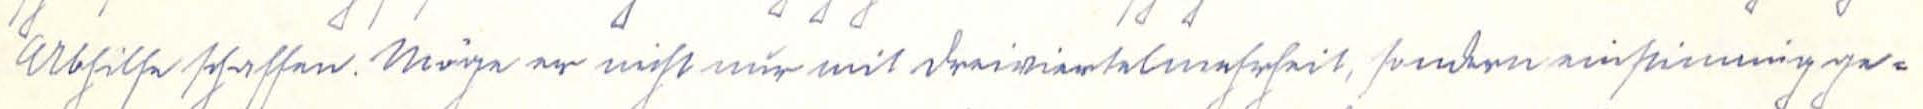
Abhilfe schaffen. Möge er nicht nur mit Dreiviertelmehrheit, sondern einstimmig ge-
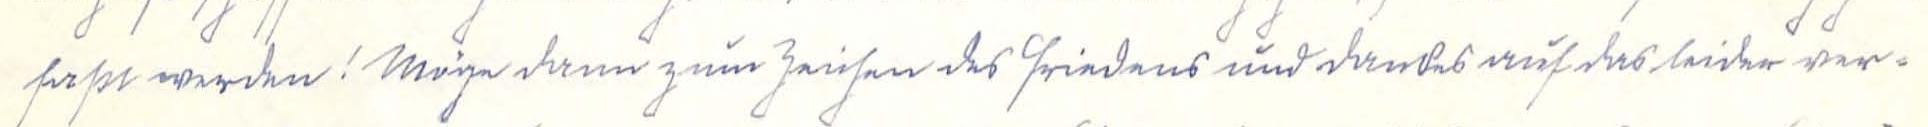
faßt werden! Möge dann zum Zeichen des Friedens und Dankes auf das leider ver-
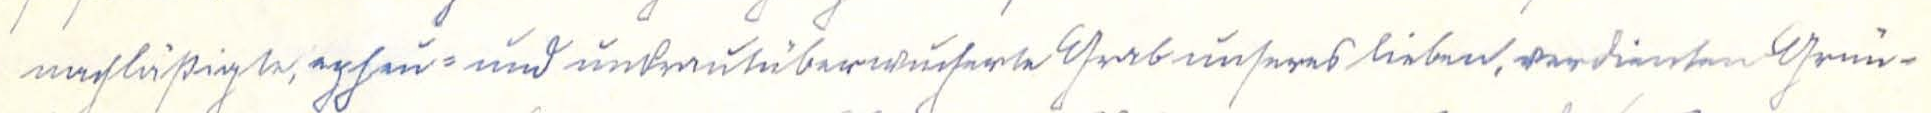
nachlässigte, epfeu - und unkrautüberwucherte Grab unseres lieben, verdienten Grün-
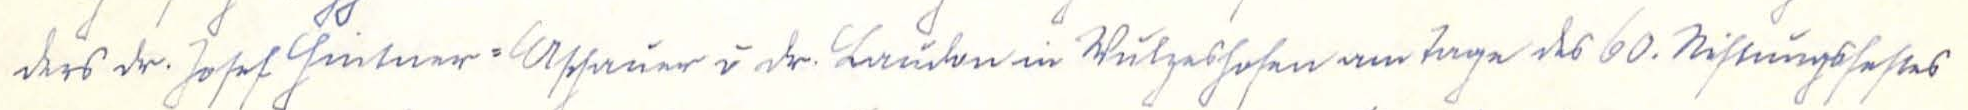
ders Dr. Josef Hintner-Aschauer v/o Dr. Laudon in Wulzeshofen am Tage des 60. Stiftungsfestes
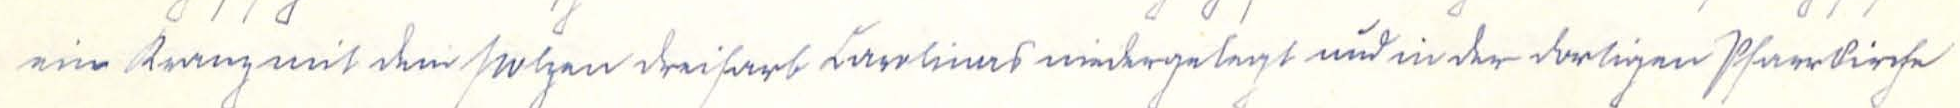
ein Kranz mit dem stolzen Dreifarb Carolinas niedergelegt und in der dortigen Pfarrkirche
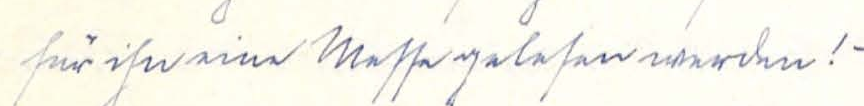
für ihn eine Messe gelesen werden!
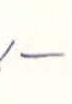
-
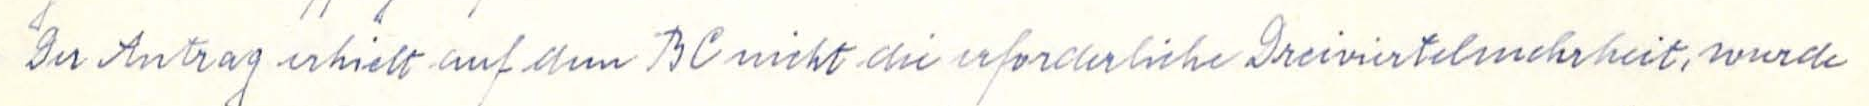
Der Antrag erhielt auf dem BC nicht die erforderliche Dreiviertelmehrheit, wurde
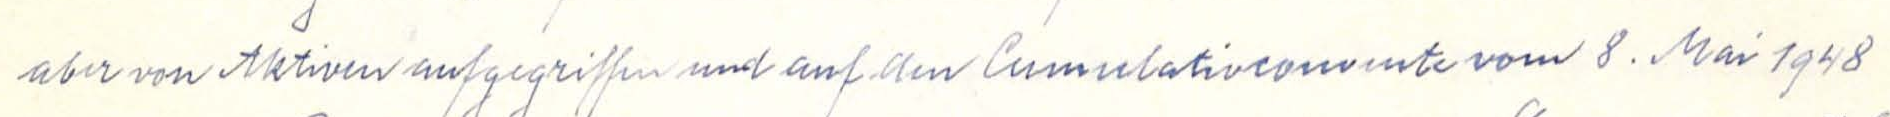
aber von Aktiven aufgegriffen und auf dem Cumulativconvente vom 8. Mai 1948
